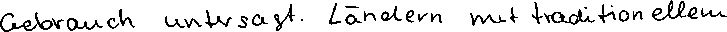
Gebrauch untersagt. Ländern mit traditionellem
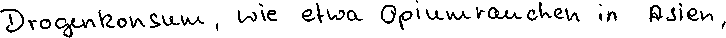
Drogenkonsum, wie etwa Opiumrauchen in Asien,
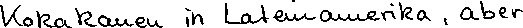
Kokakauen in Lateinamerika, aber
